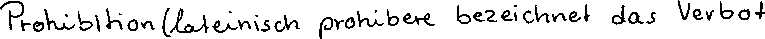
Prohibition (lateinisch prohibere bezeichnet das Verbot
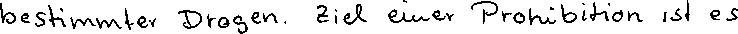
bestimmter Drogen. Ziel einer Prohibition ist es
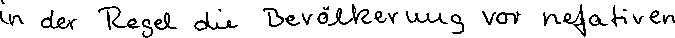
in der Regel die Bevölkerung vor negativen
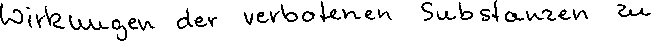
Wirkungen der verbotenen Substanzen zu
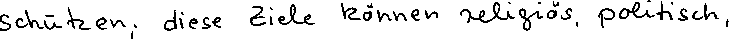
schützen; diese Ziele können religiös, politisch,
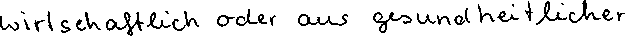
wirtschaftlich oder aus gesundheitlicher
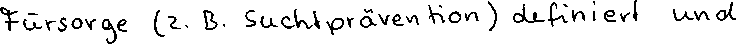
Fürsorge (z. B. Suchtprävention) definiert und
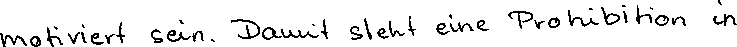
motiviert sein. Damit steht eine Prohibition in
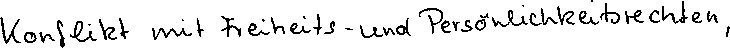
Konflikt mit Freiheits- und Persönlichkeitsrechten,
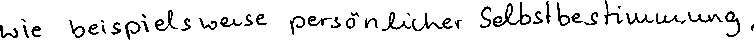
wie beispielsweise persönlicher Selbstbestimmung,
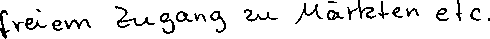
freiem Zugang zu Märkten etc.
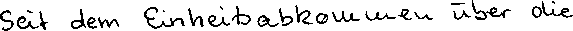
Seit dem Einheitsabkommen über die
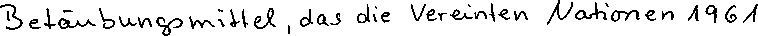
Betäubungsmittel, das die Vereinten Nationen 1961
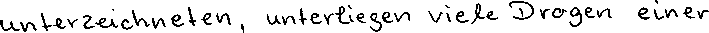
unterzeichneten, unterliegen viele Drogen einer
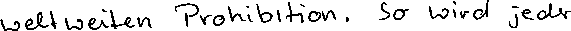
weltweiten Prohibition. So wird jeder
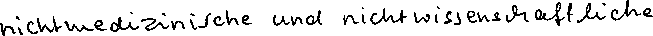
nichtmedizinische und nichtwissenschaftliche
